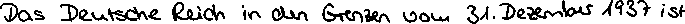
Das Deutsche Reich in den Grenzen vom 31. Dezember 1937 ist
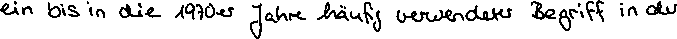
ein bis in die 1970er Jahre häufig verwendeter Begriff in der
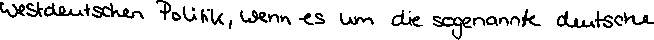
westdeutschen Politik, wenn es um die sogenannte deutsche
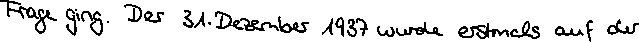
Frage ging. Der 31. Dezember 1937 wurde erstmals auf der
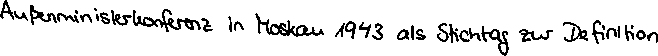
Außenministerkonferenz in Moskau 1943 als Stichtag zur Definition
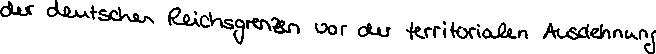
der deutschen Reichsgrenzen vor der territorialen Ausdehnung
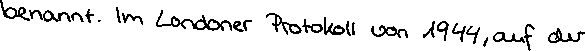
benannt. Im Londoner Protokoll von 1944, auf der
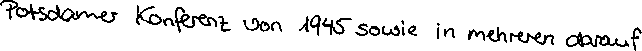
Potsdamer Konferenz von 1945 sowie in mehreren darauf
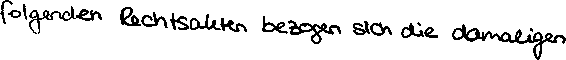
folgenden Rechtsakten bezogen sich die damaligen
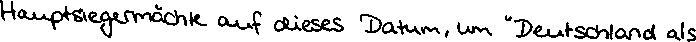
Hauptsiegermächte auf dieses Datum, um "Deutschland als
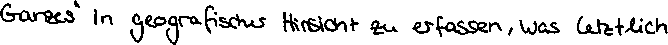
Ganzes" in geografischer Hinsicht zu erfassen, was letztlich
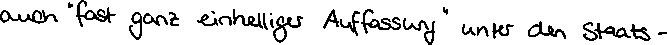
auch "fast ganz einhelliger Auffassung" unter den Staats-
